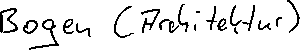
Bogen (Architektur)
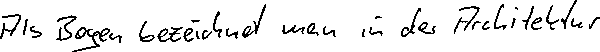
Als Bogen bezeichnet man in der Architektur
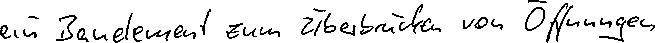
ein Bauelement zum Überbrücken von Öffnungen
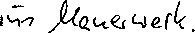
im Mauerwerk.
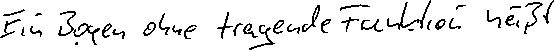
Ein Bogen ohne tragende Funktion heißt
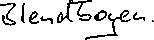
Blendbogen.
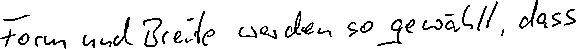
Form und Breite werden so gewählt, dass
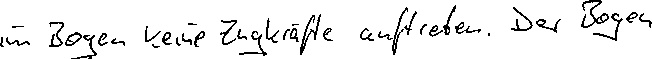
im Bogen keine Zugkräfte auftreten. Der Bogen
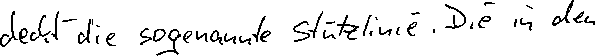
deckt die sogenannte Stützlinie. Die in den
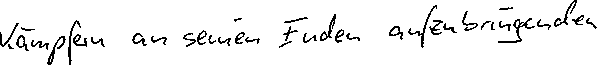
Kämpfern an seinen Enden aufzubringenden
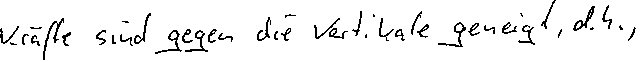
Kräfte sind gegen die Vertikale geneigt, d. h.,
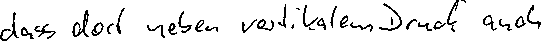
dass dort neben vertikalem Druck auch
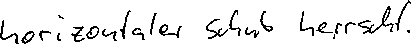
horizontaler Schub herrscht.
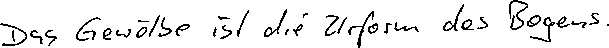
Das Gewölbe ist die Urform des Bogens.
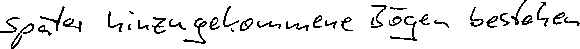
Später hinzugekommene Bögen bestehen
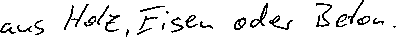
aus Holz, Eisen oder Beton.
